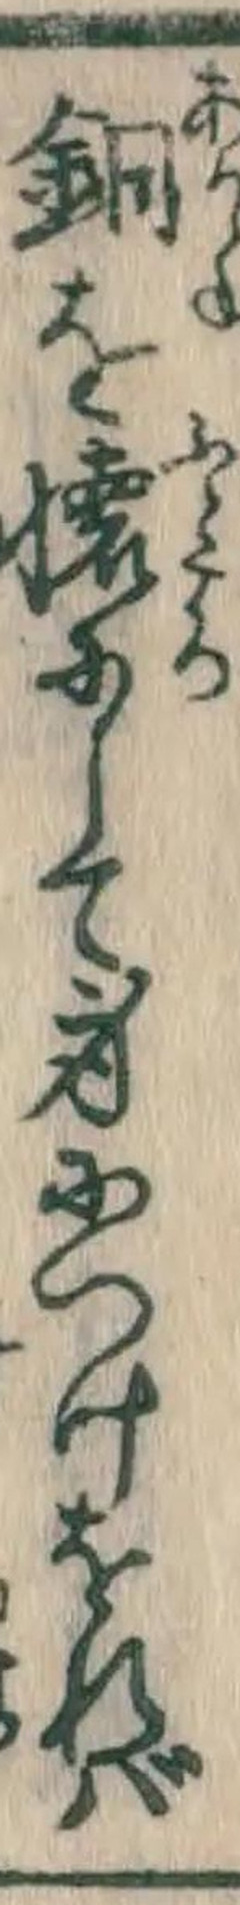銅を懐にして身につけをれば
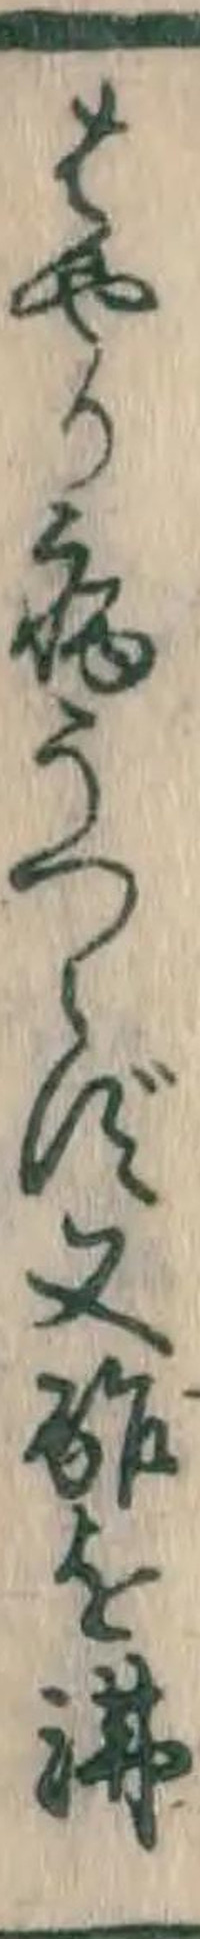はやり病うつらず又酢を沸

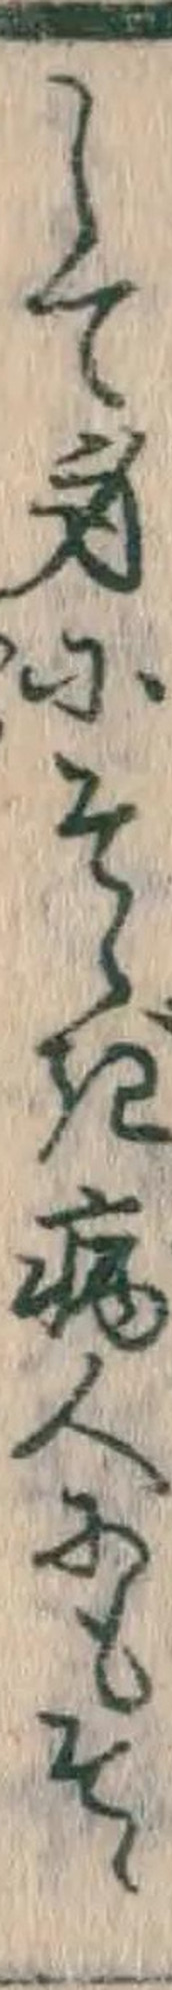して身にそゝぎ病人にもそゝ
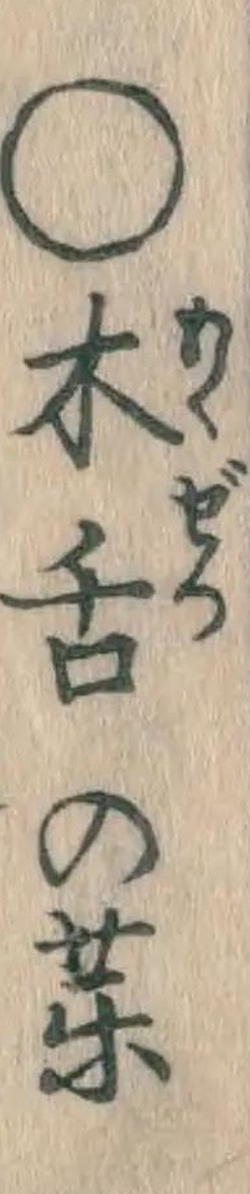○木舌の薬
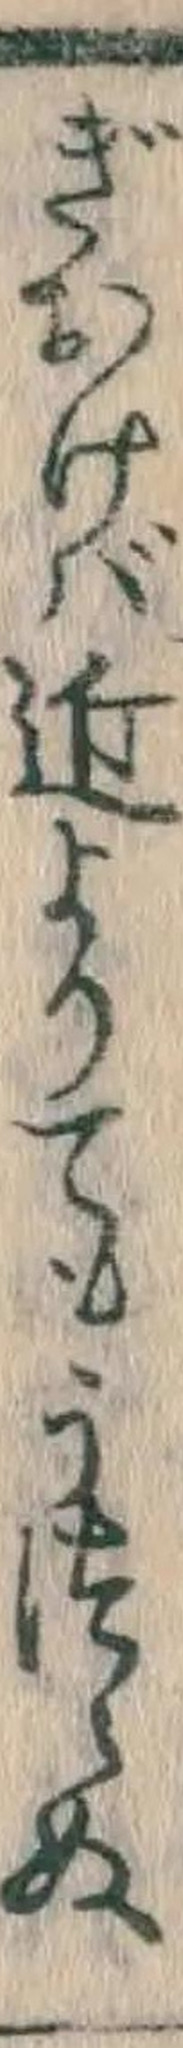ぎおけば近よりてもうつらぬ
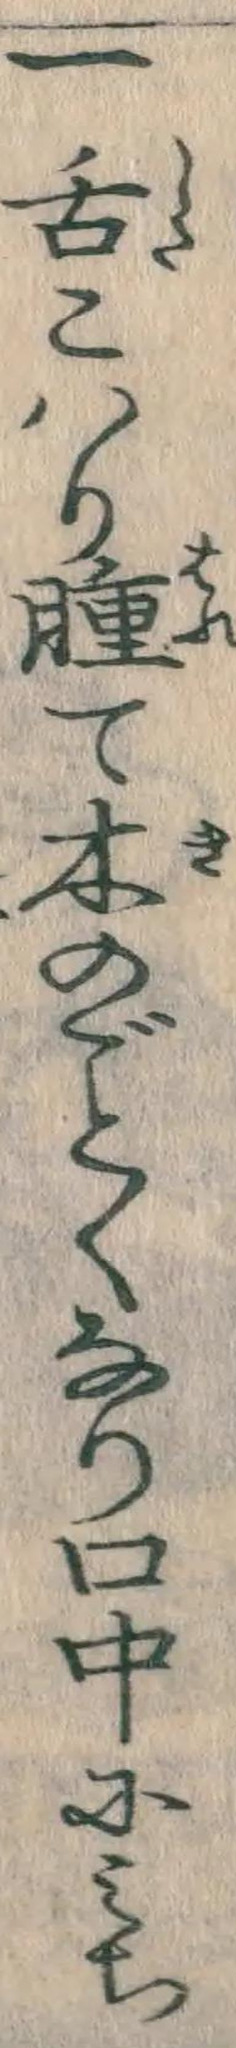一舌こはり腫て木のごとくなり口中にみち
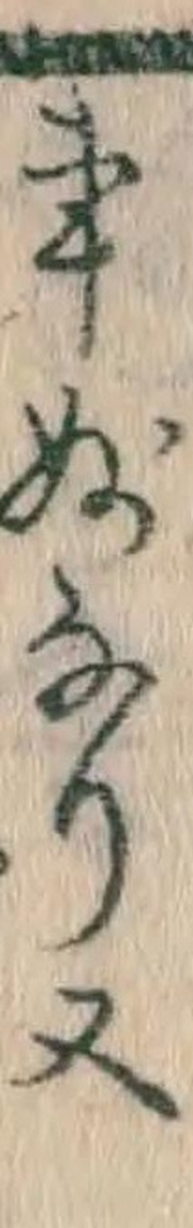事妙なり又
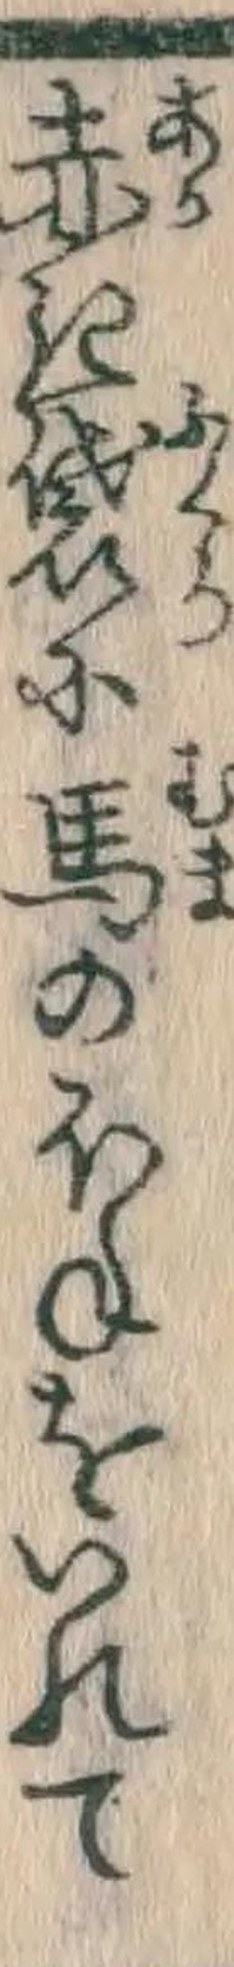赤き袋に馬のほねをいれて
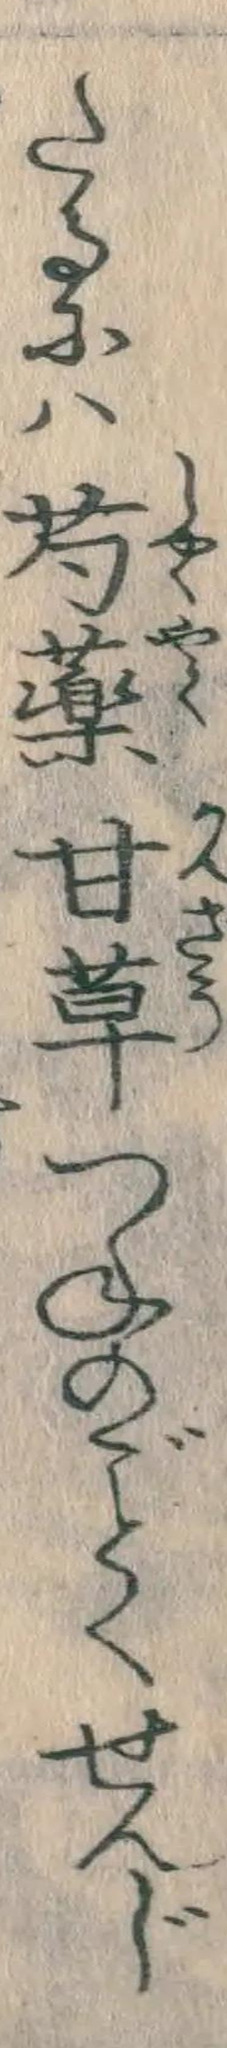たるには芍薬甘草つねのごとくせんじ
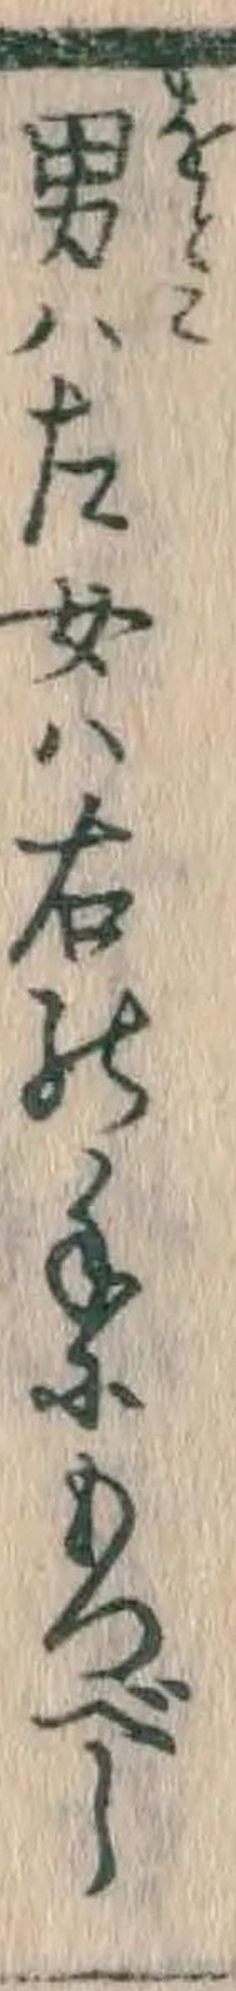男は左女は右の手にもつべし
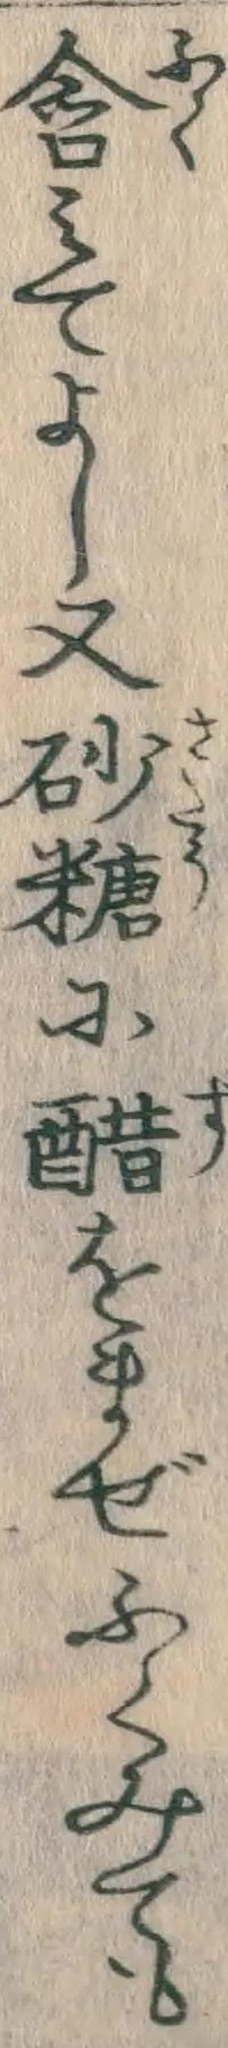含みてよし又砂糖に醋をまぜふくみても
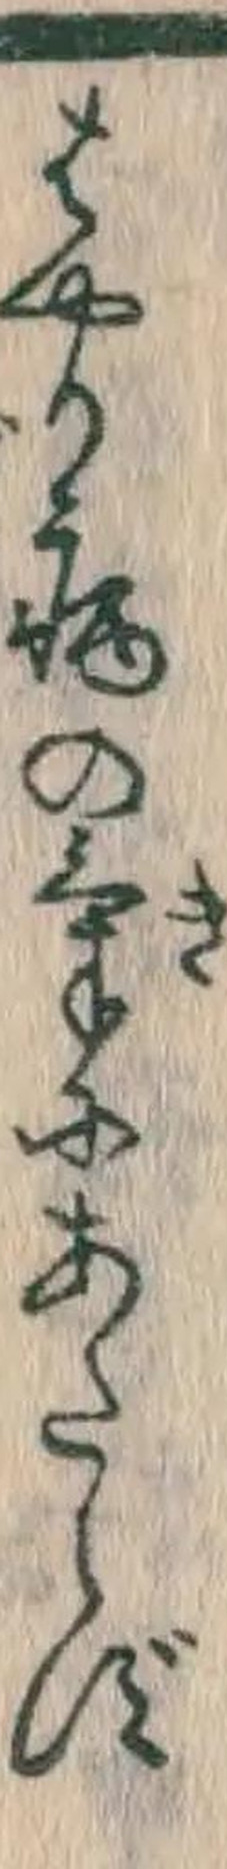はやり病の気にあたらず
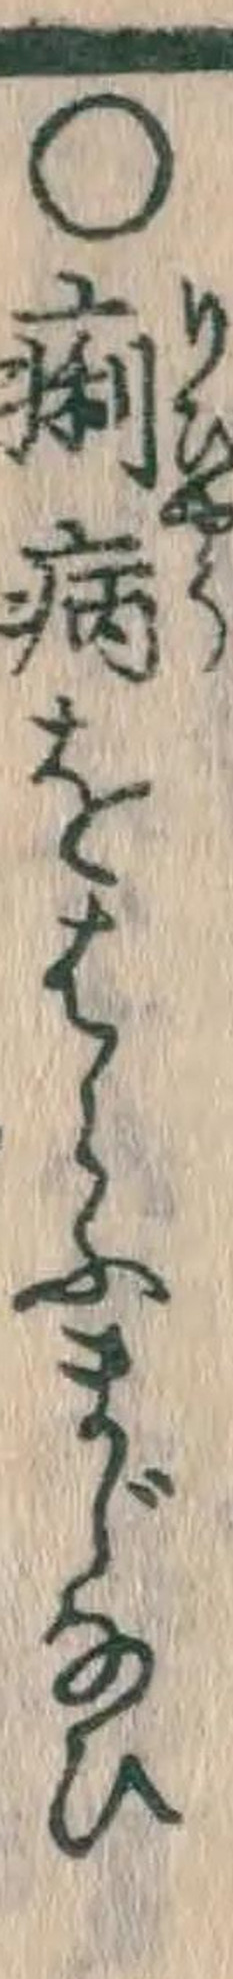○痢病をはらふまじなひ
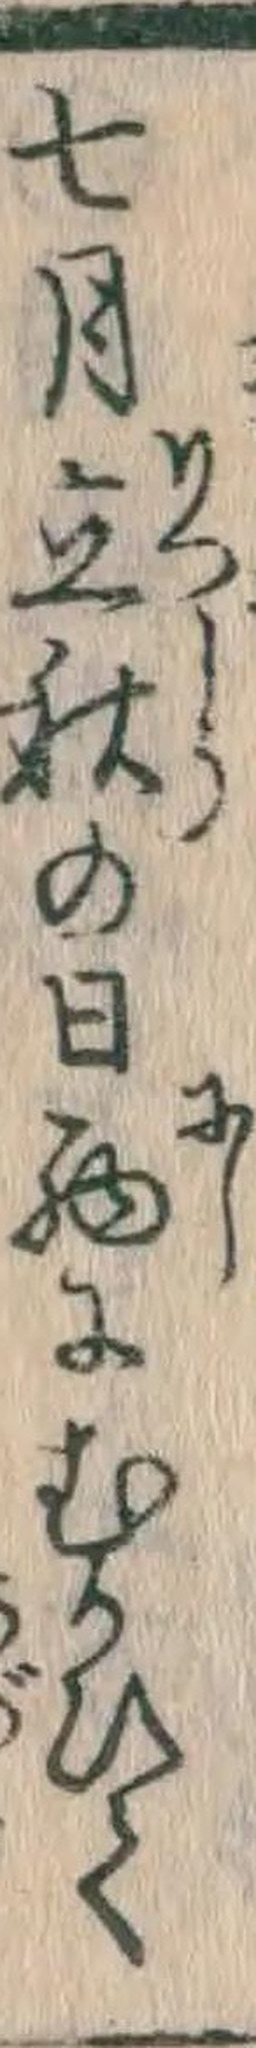七月立秋の日西にむかひて
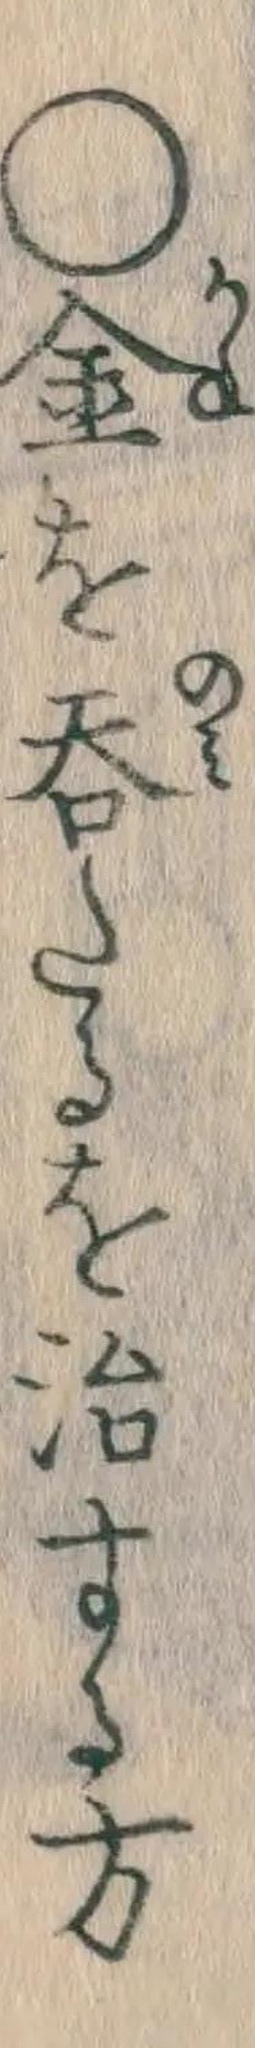○金を吞たるを治する方
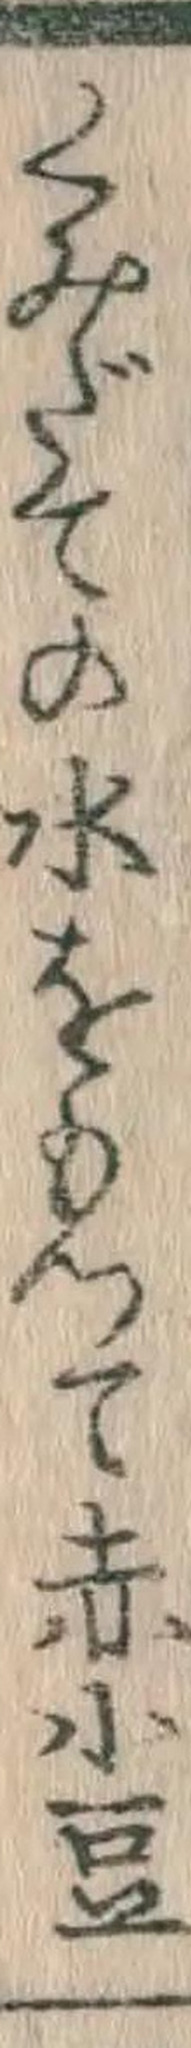くみだての水をもつて赤小豆
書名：広益秘事大全 3巻. [4]
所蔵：国立国会図書館 National Diet Library, JAPAN
